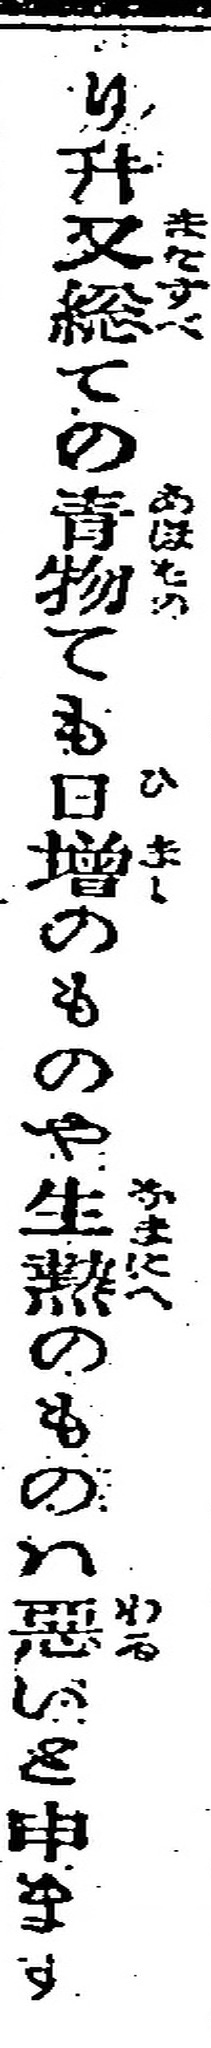り升又総ての青物ても日増のものや生熱のものは惡いと申ます
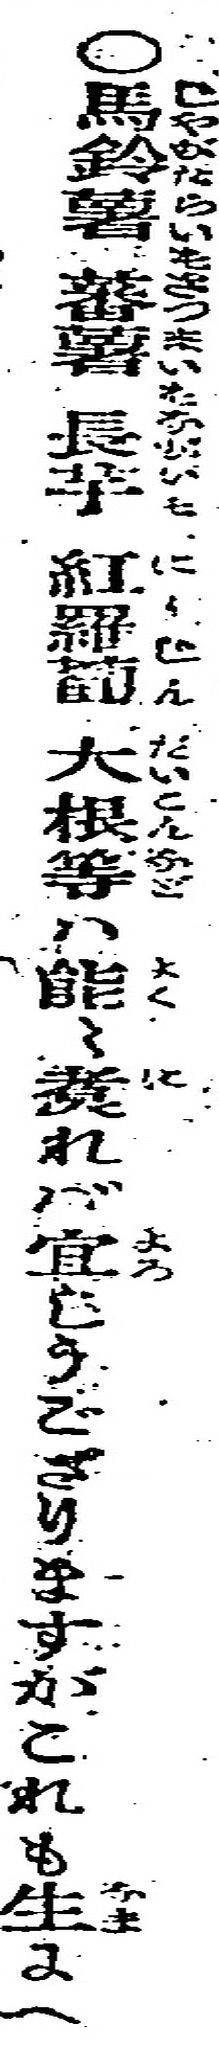〇馬鈴薯蕃薯長芋紅羅荀大根等は能々煑れば宜しうござりますがこれも生にへ
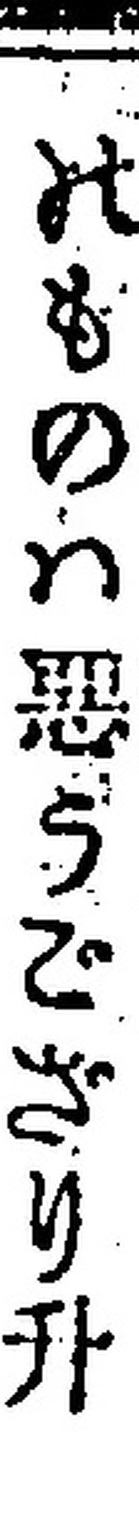のものは惡うござり升
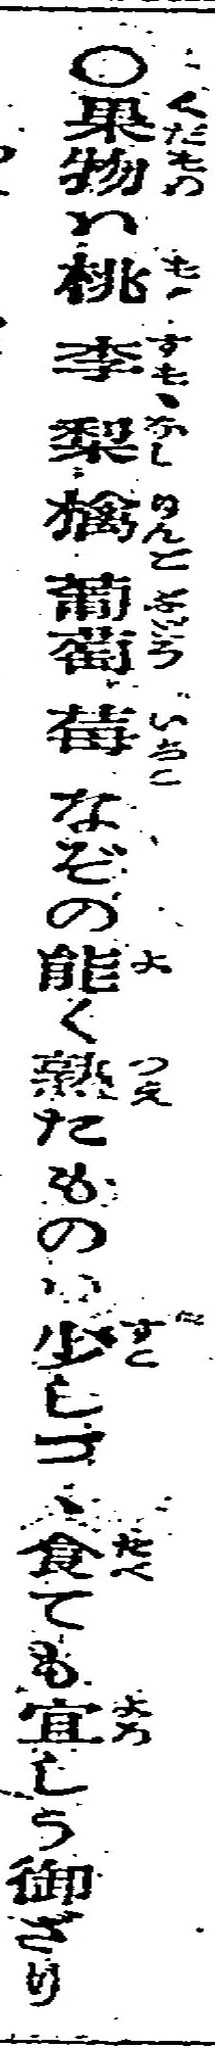〇果物は桃李梨林檎葡萄苺なぞの能く熟たものは少しづゝ食ても宜しう御ざり
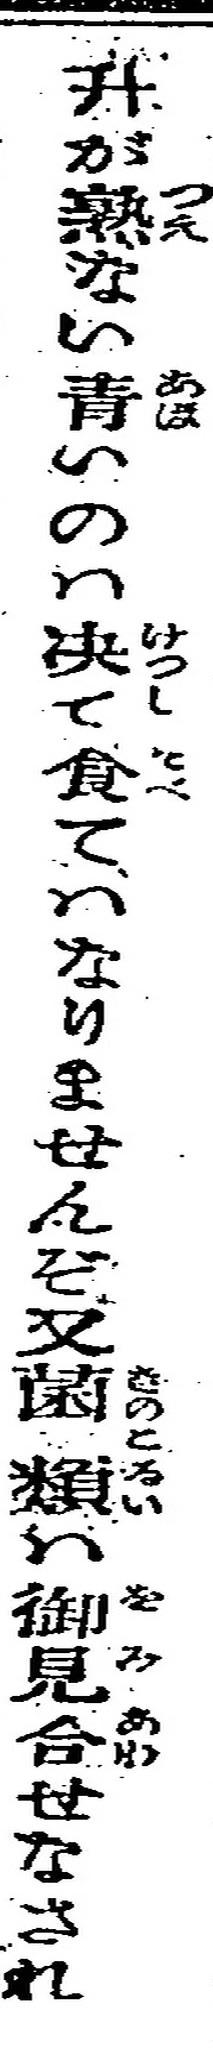升が熟ない青いのは決て食てｈあなりませんぞ又菌類は御見合せなされ
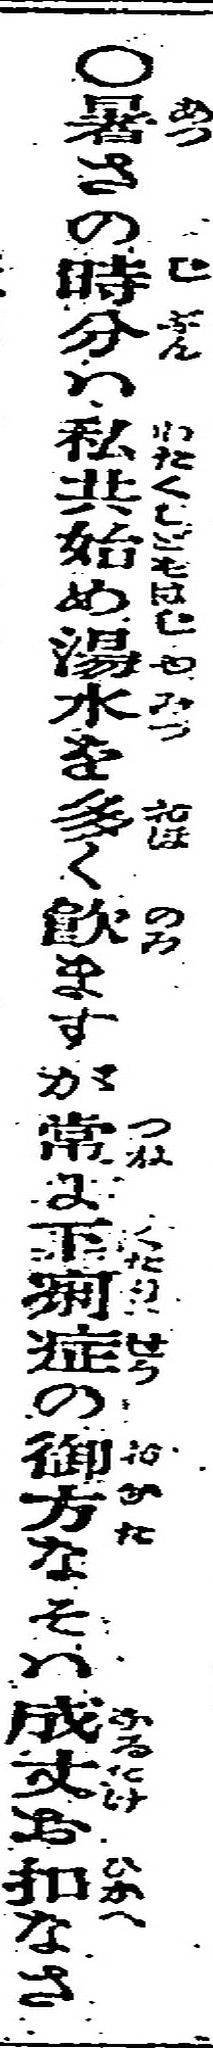〇暑さの時分は私共始め湯水を多く飲ますが常に下痢症の御方なぞは成丈お扣なさ
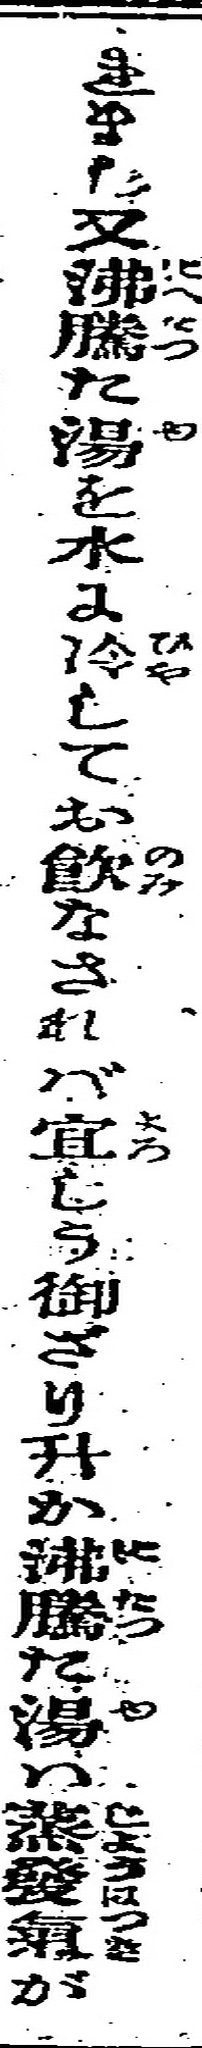れまた又沸騰た湯を水に冷してお飲なされば宜しう御ざり升か沸騰た湯は蒸發気が
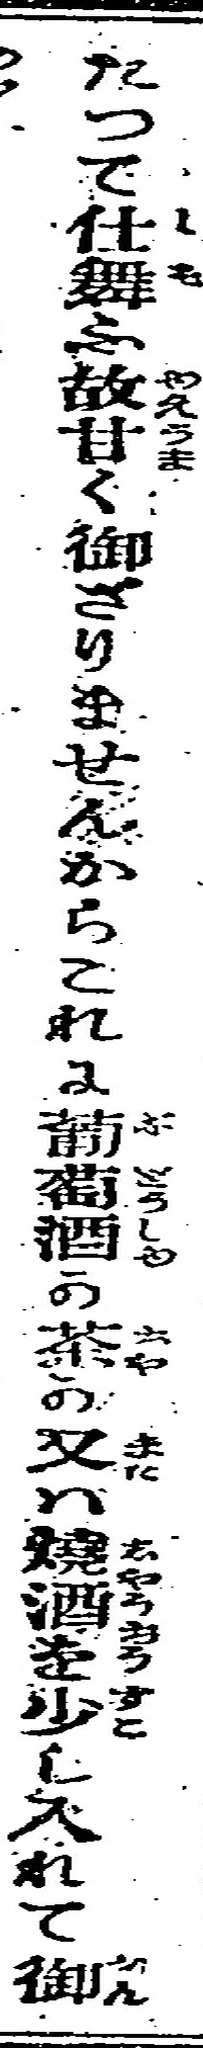たつて仕舞ふ故甘く御ざりませんからこれに葡萄酒か茶の又は焼酎を少し入れて御
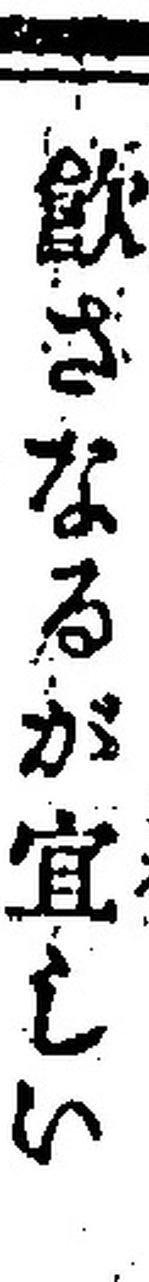飲さなるが宜しい
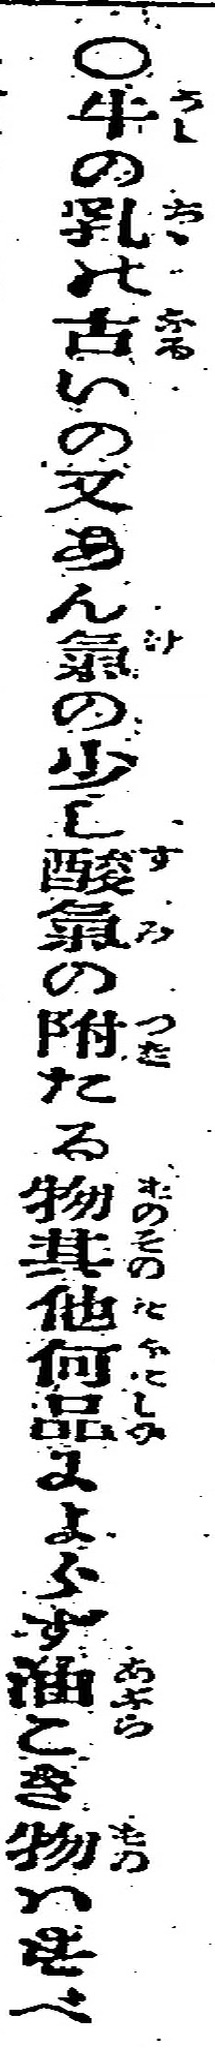〇牛の乳の古いの又あん気の少し酸気の附たる物其他何品によらず油こき物はすべ
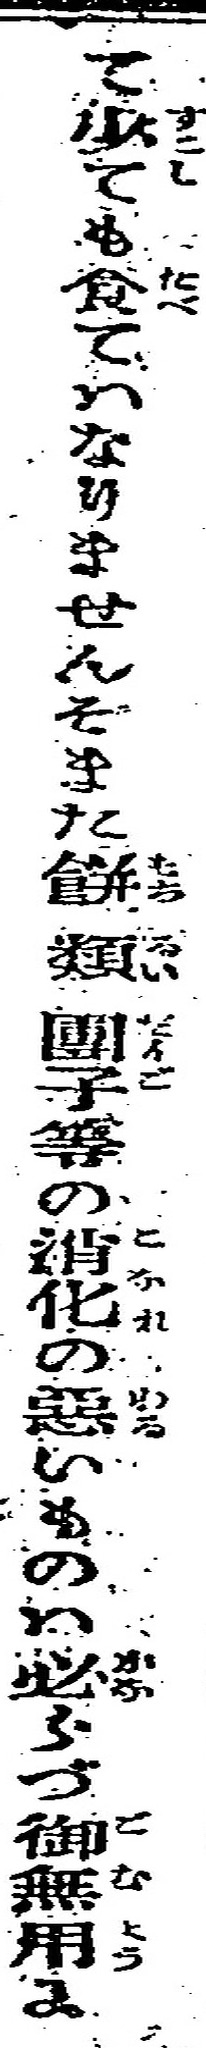て少ても食てはなりませんぞまた餅類團子等の消化の惡いものは必らづ御無用に
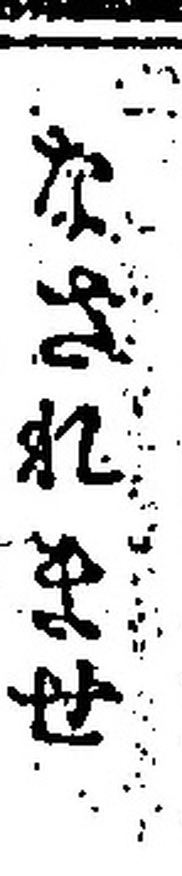なされませ
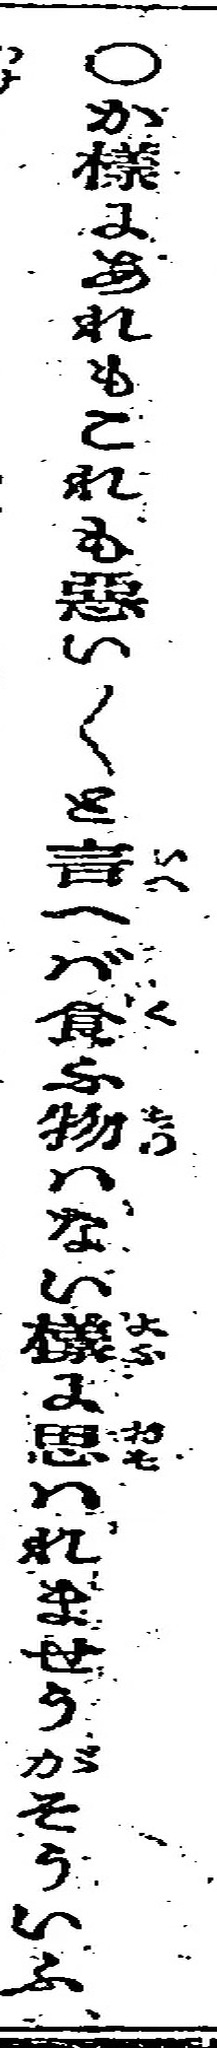〇か様にあれもこれ惡い〳〵と言へば食ふ物はない様に思はれませうがそういふ
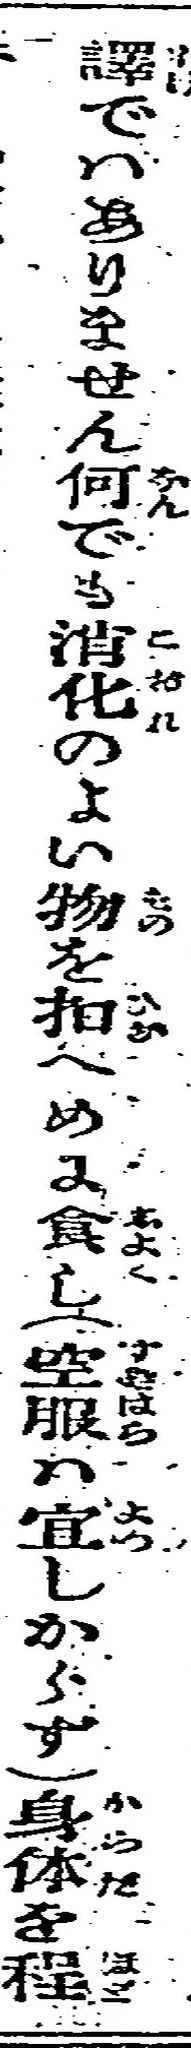譯ではありません何でも消化のよい物を扣へめに食し[空服は宜しからず]身体を程
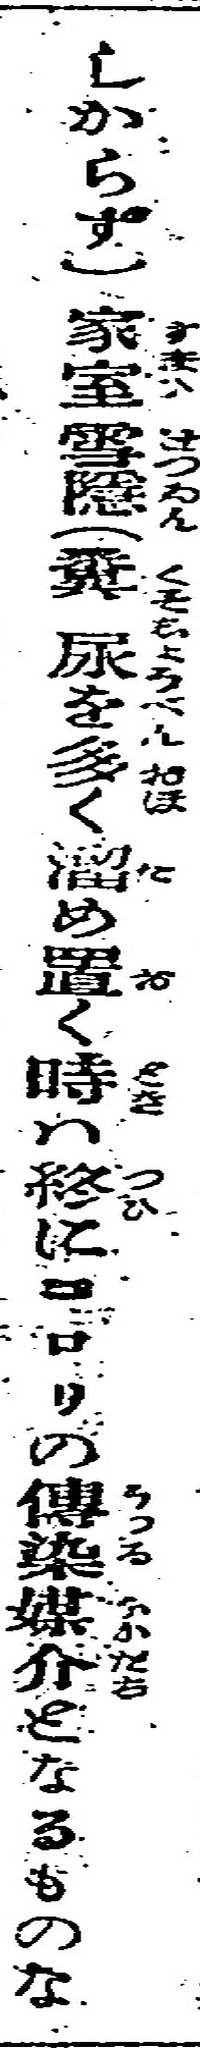しからず]家室雪隠[糞尿を多く溜め置く時は終にコロリの傅染媒介となるものな
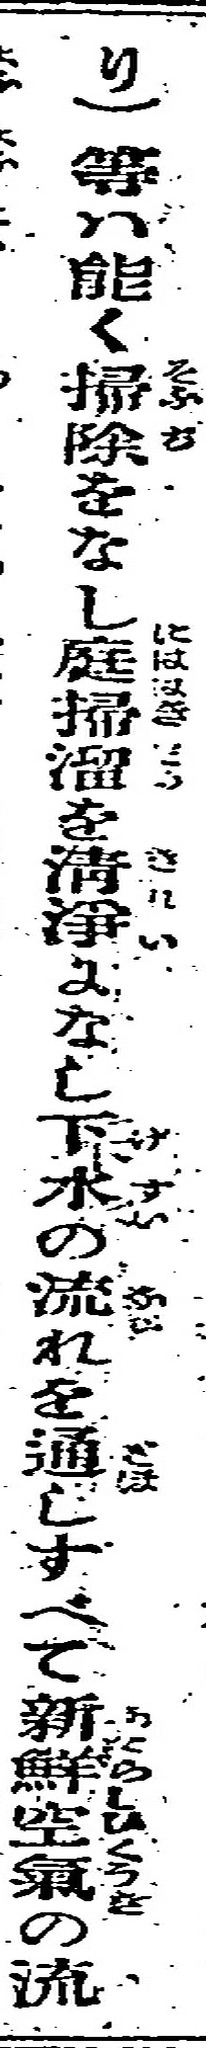り]等は能く掃除をなし庭掃溜を清浄になし下水の流れを通しすべて新鮮空気の流
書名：虎列剌病予防の心得
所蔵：国立国会図書館 National Diet Library, JAPAN
